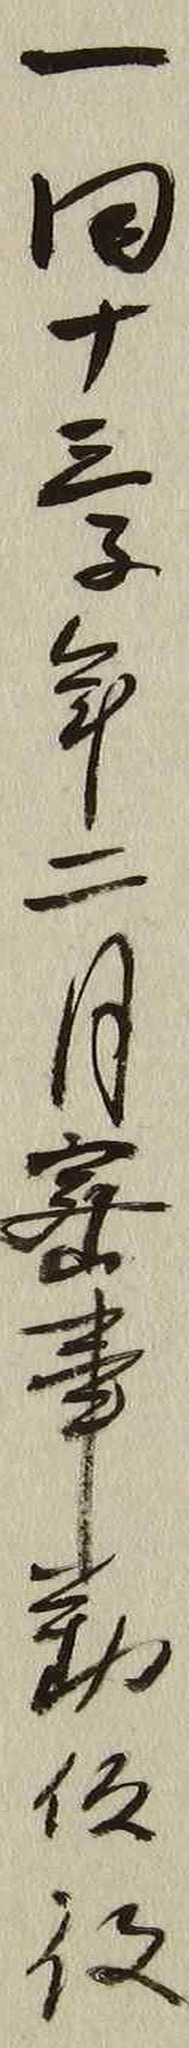一同十三子年二月密事勤仮役
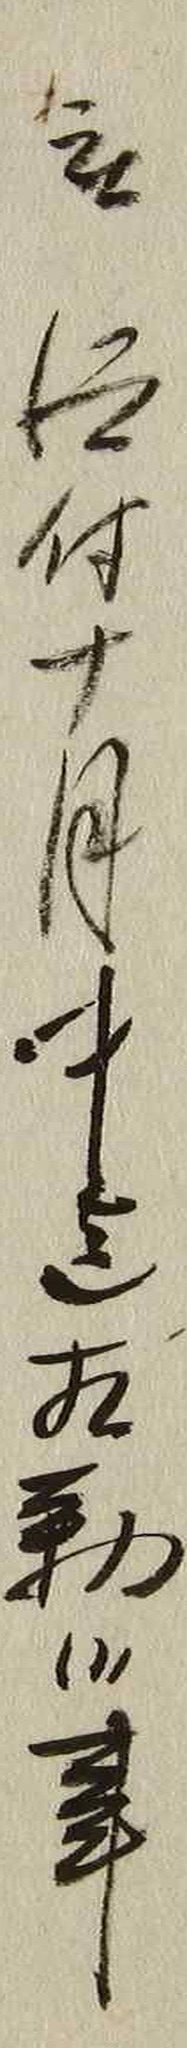被仰付十月中迄相勤候事
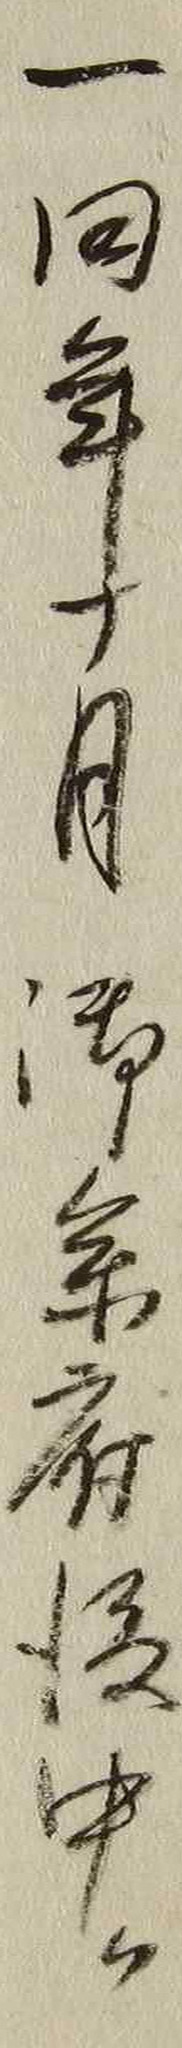一同年十月御参府後中ケ
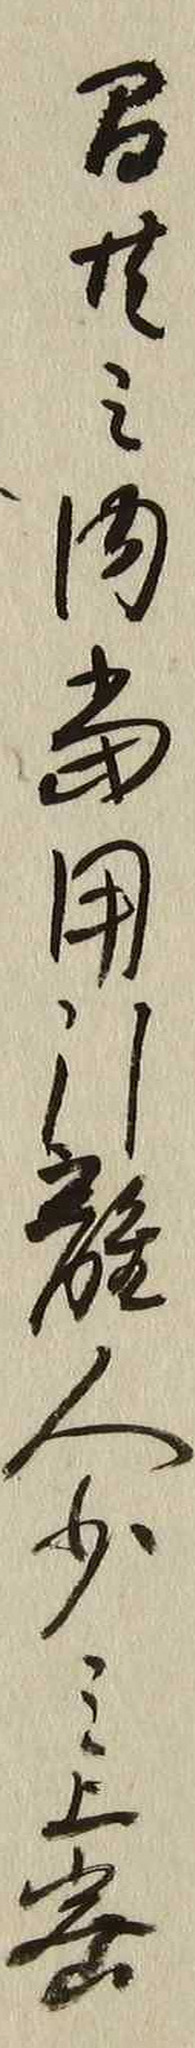間共之内当用引離人少之上密
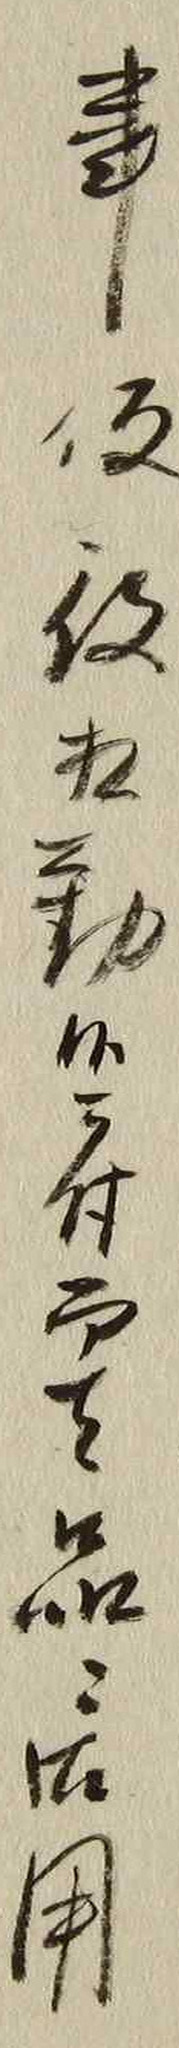事仮役相勤候ニ付而者品々御用
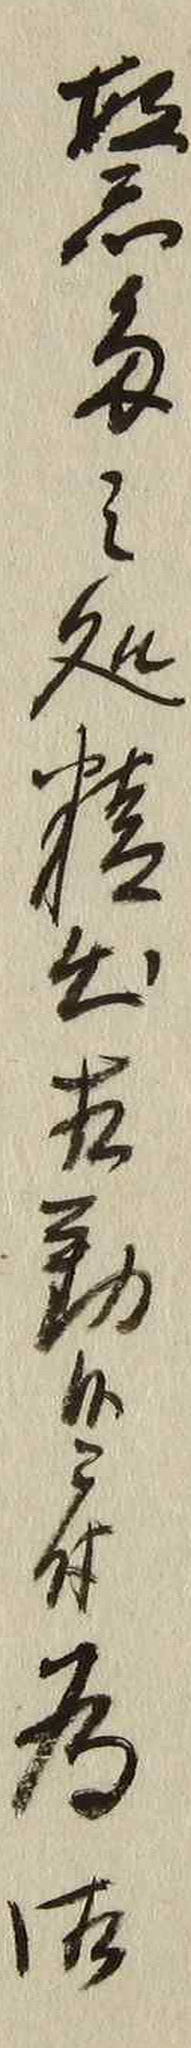繁多之処精出相勤候ニ付為御
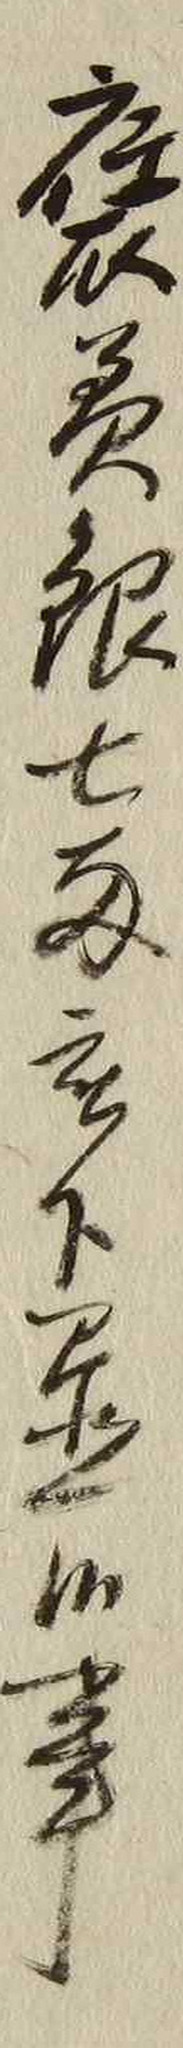褒美銀七両被下置候事
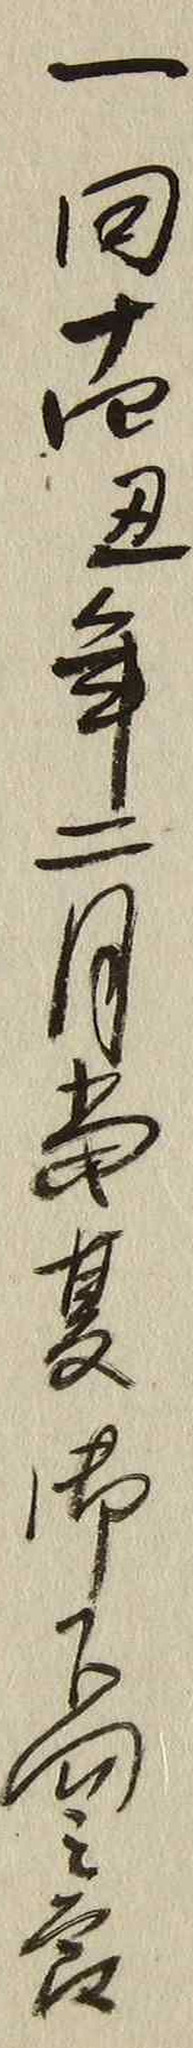一同十四丑年二月当夏御下向之節
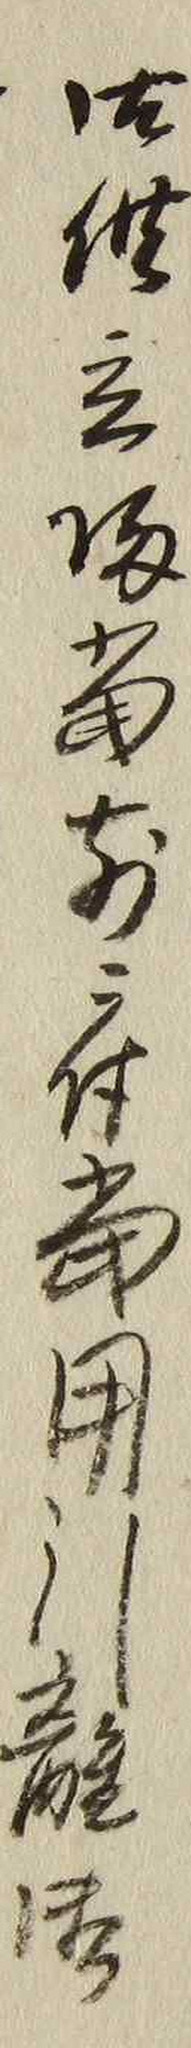御供立帰当前ニ付当用引離御
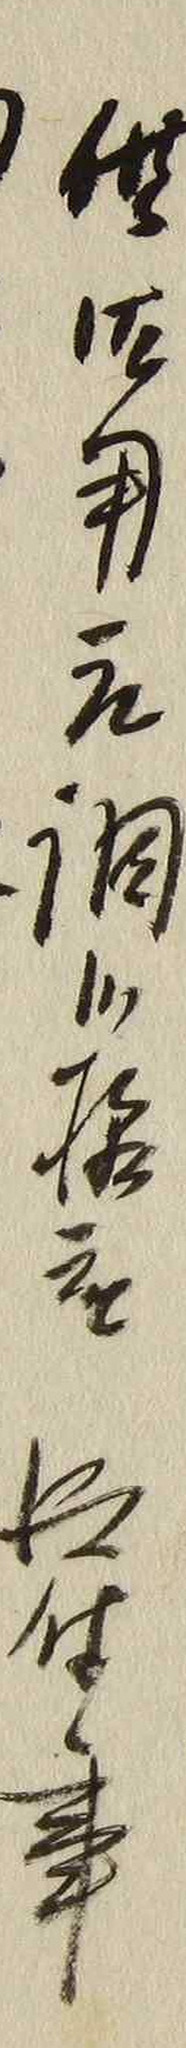供御用取調候様被仰付候事
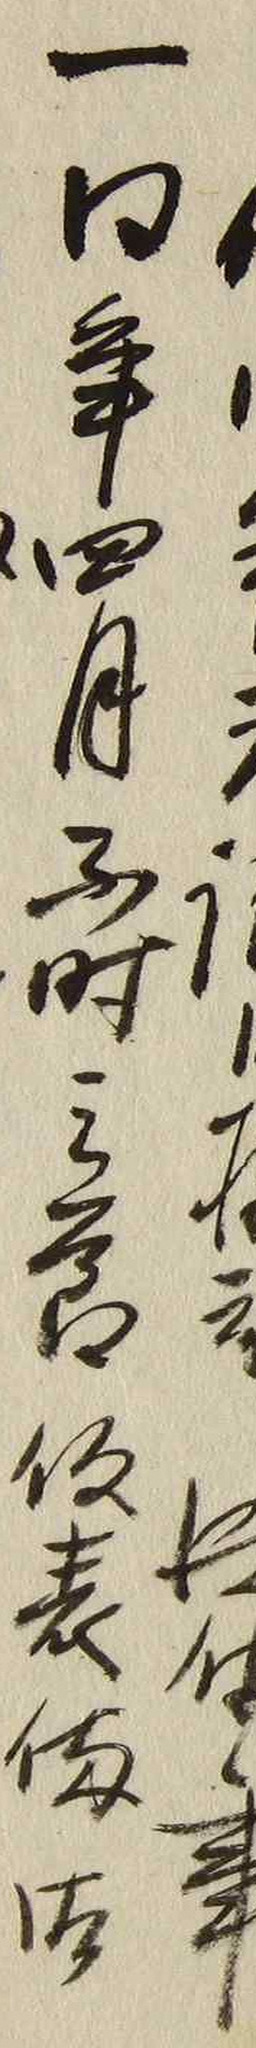一同年四月不時之節仮表備御
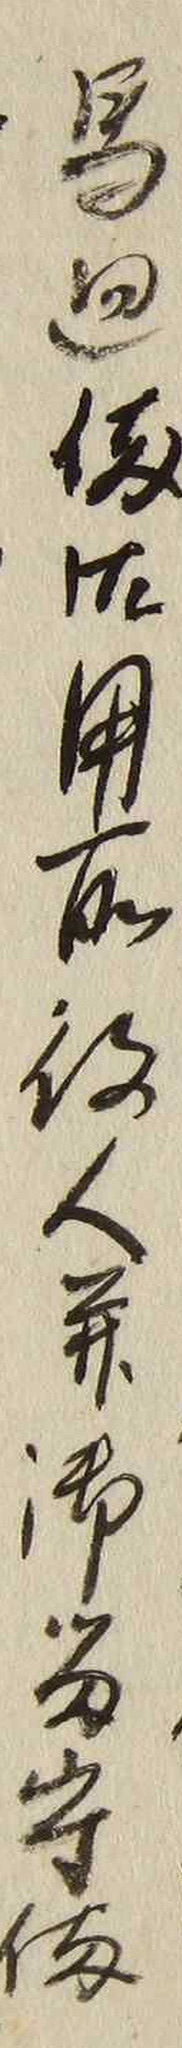馬廻備御用所役人并御留守備
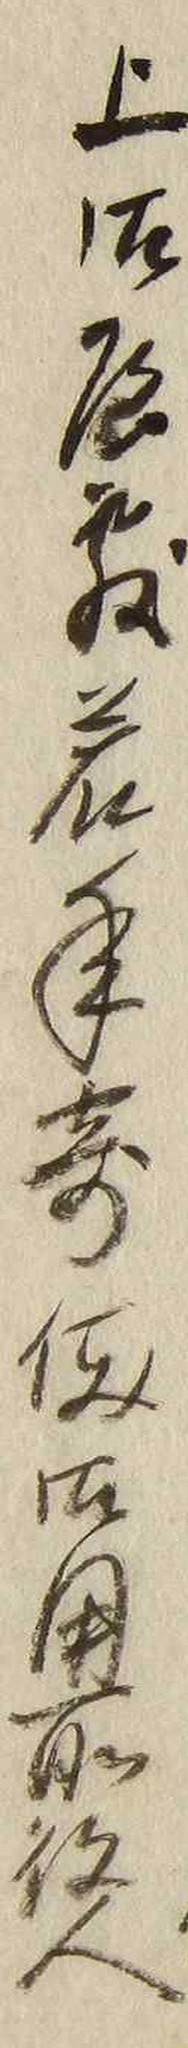上御屋敷若年寄備御用所役人

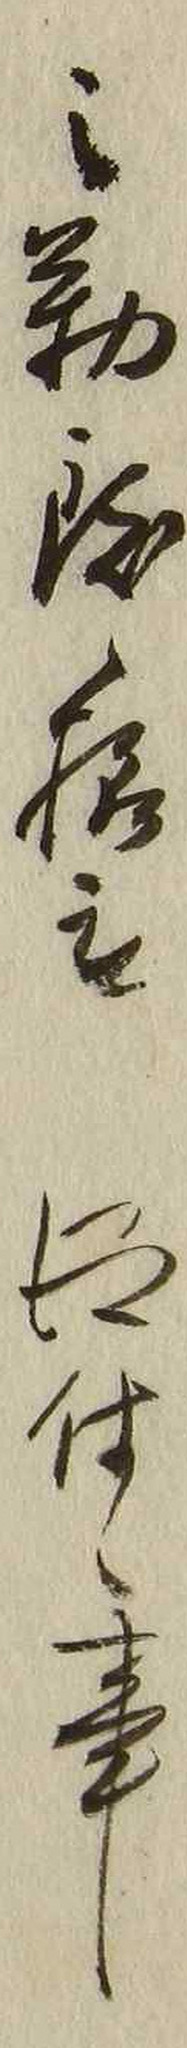之勤致候様被仰付候事
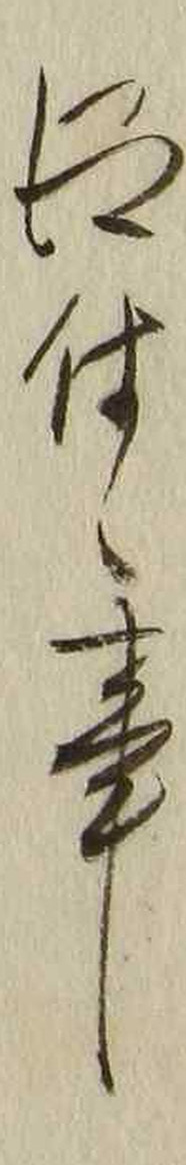仰付候事
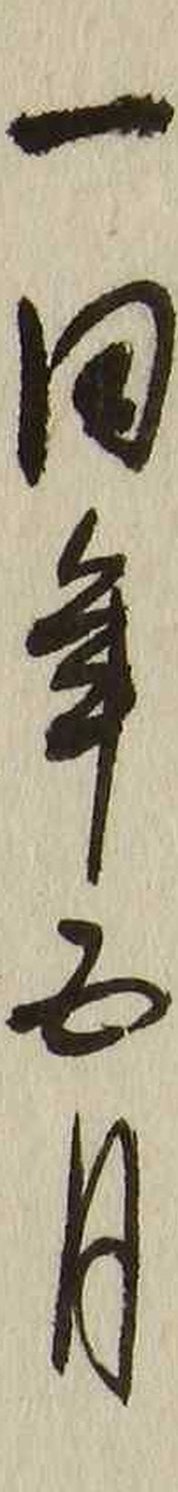一同年五月
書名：諸士系譜　巻之353　す之部3
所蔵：会津若松市立会津図書館
